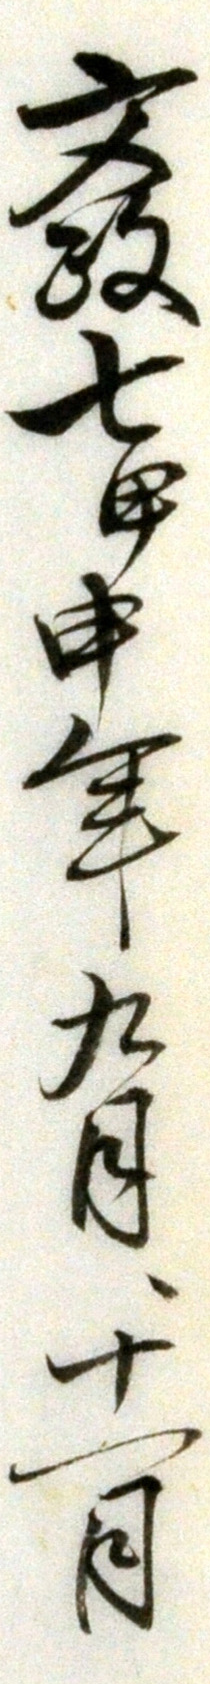文政七申申年九月、十一月

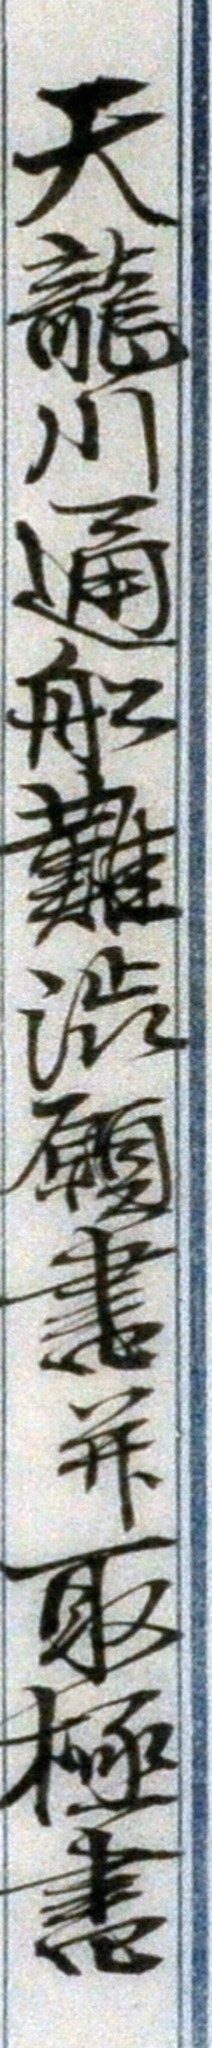天龍川通舩難渋願書并取極書
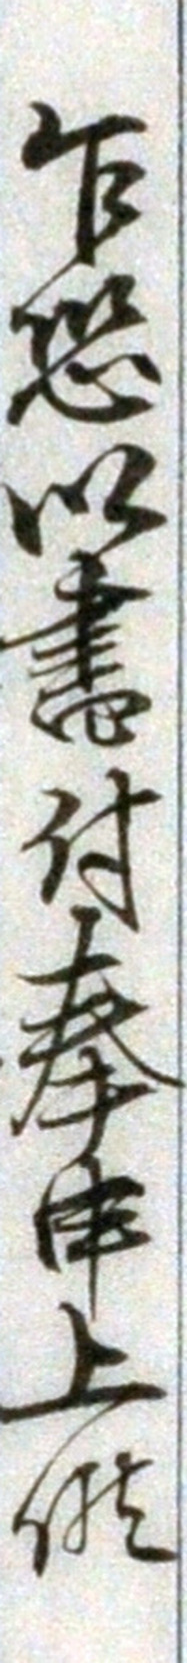乍恐以書付奉申上候
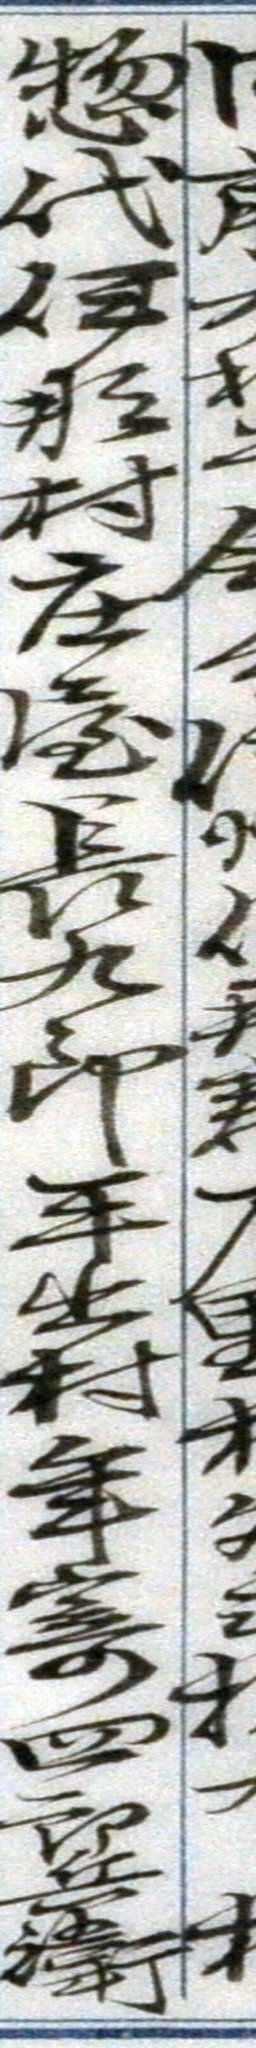惣代伊那村庄屋長九郎平出村年寄四郎兵衛
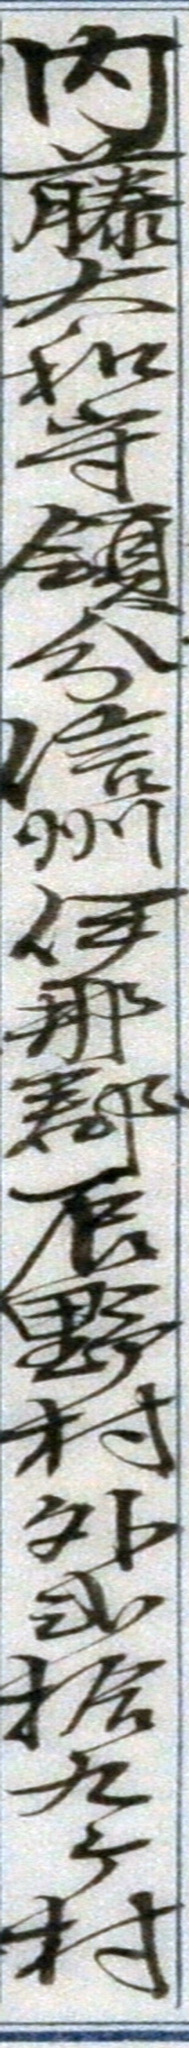内藤大和守領分信州伊奈郡辰野村外弐拾九ヶ村
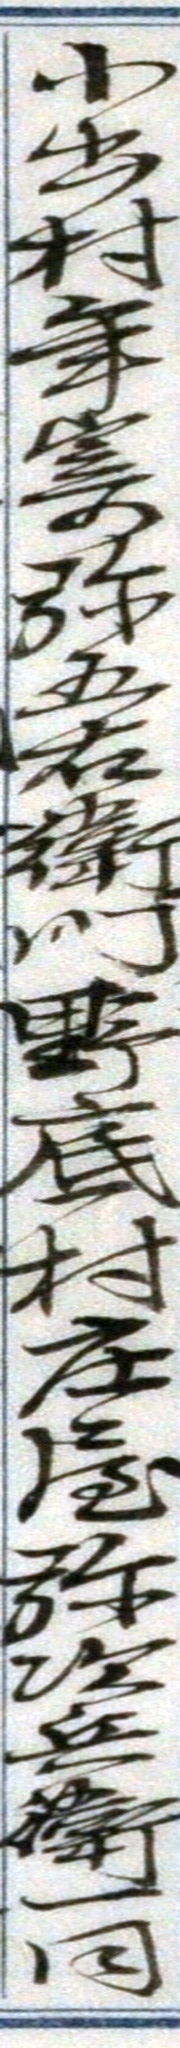小出村年寄弥五右衛門野底村庄屋弥次兵衛一同
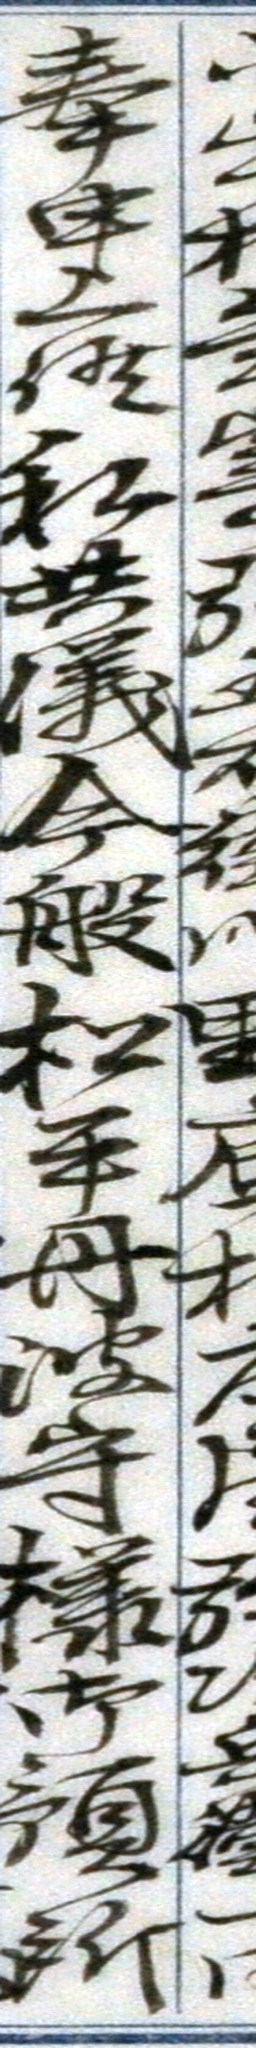奉申上候私共儀今般松平丹波守様御預所
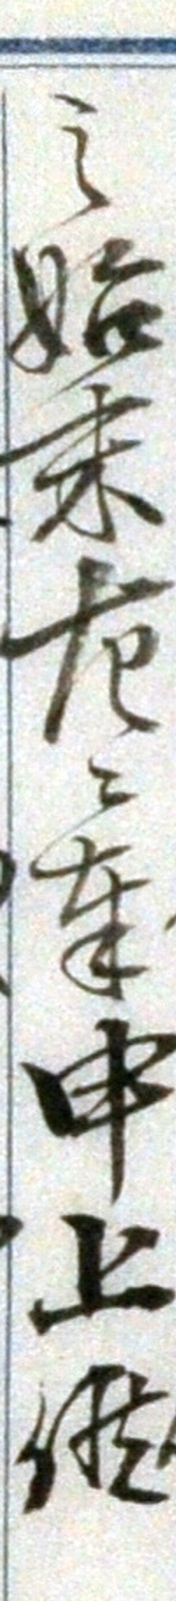之始末左ニ奉申上候
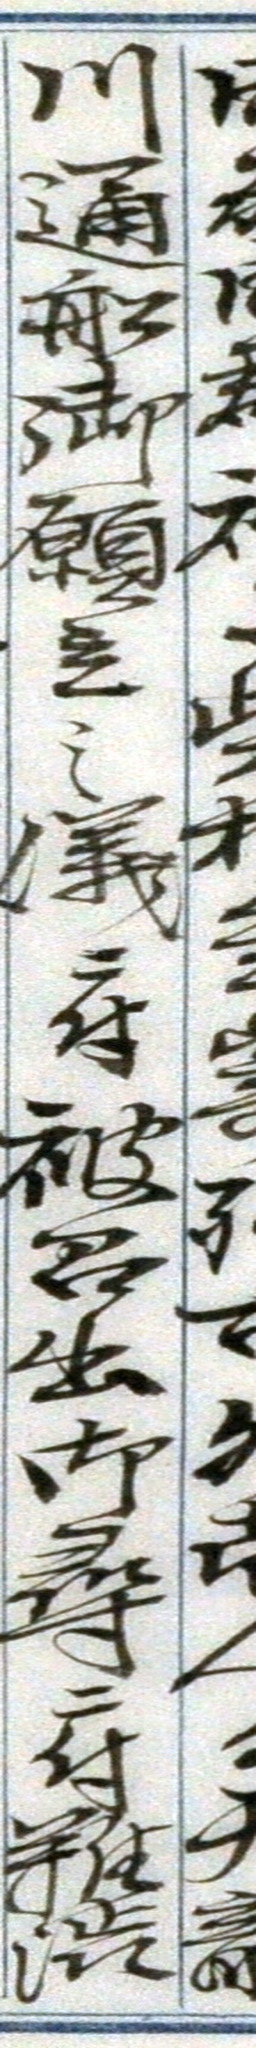川通舩御願立之儀ニ付被召出御尋ニ付難渋
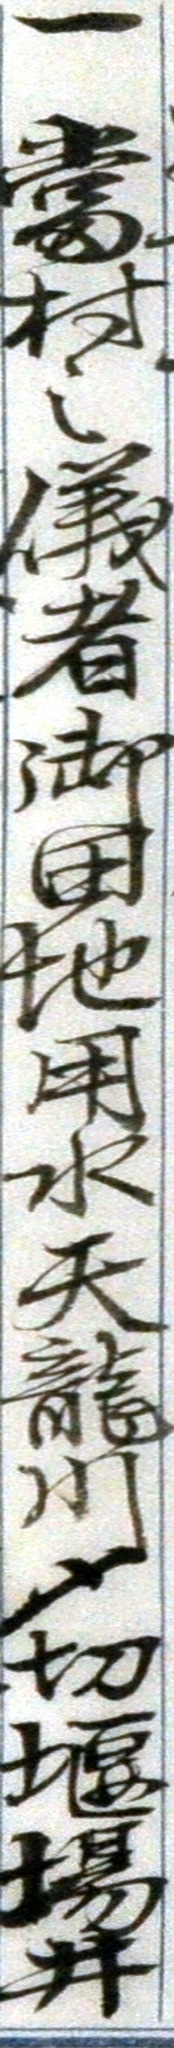一当村之儀者御田地用水天龍川〆切堰場井
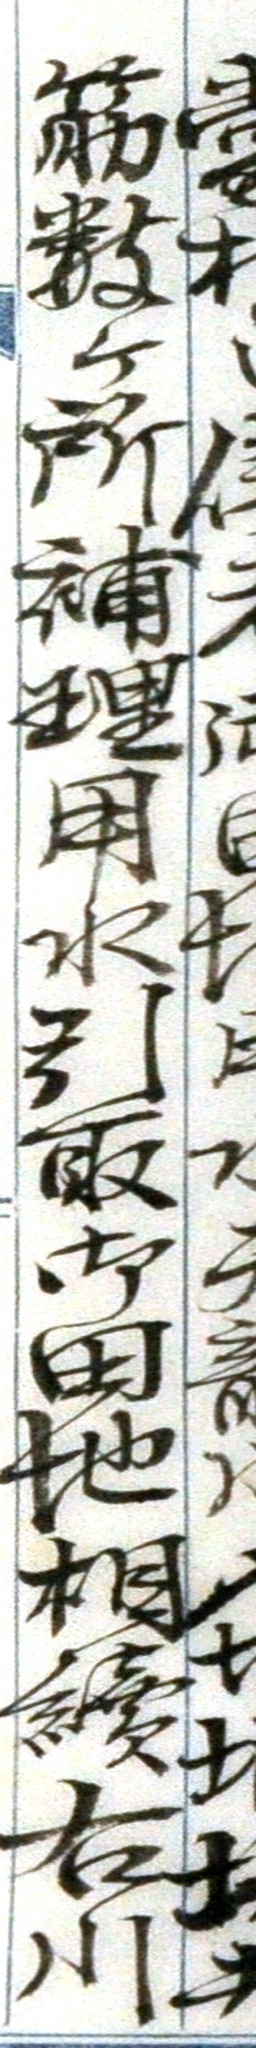筋数ケ所補理用水引取御田地相続右川

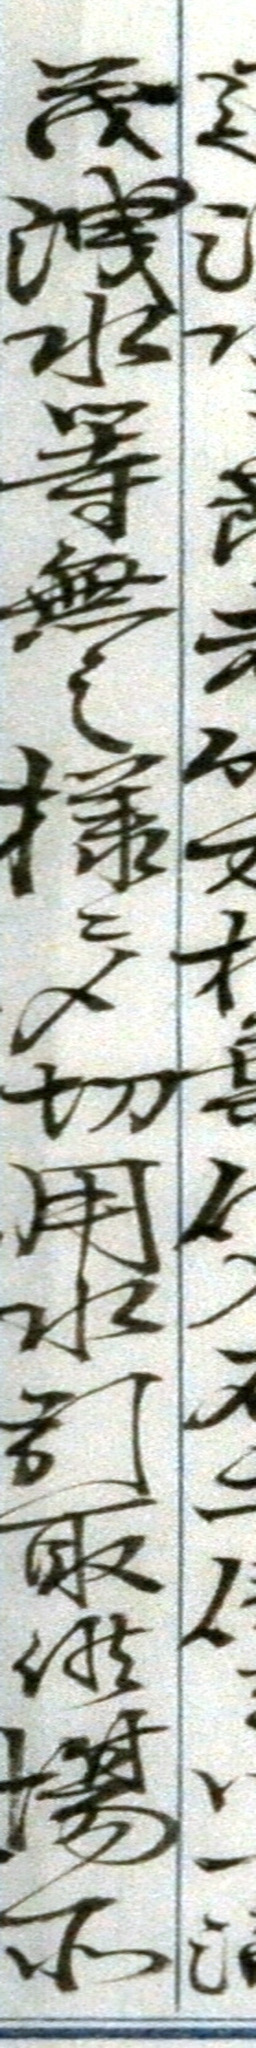茂漏水等無之様ニ〆切用水引取候場所
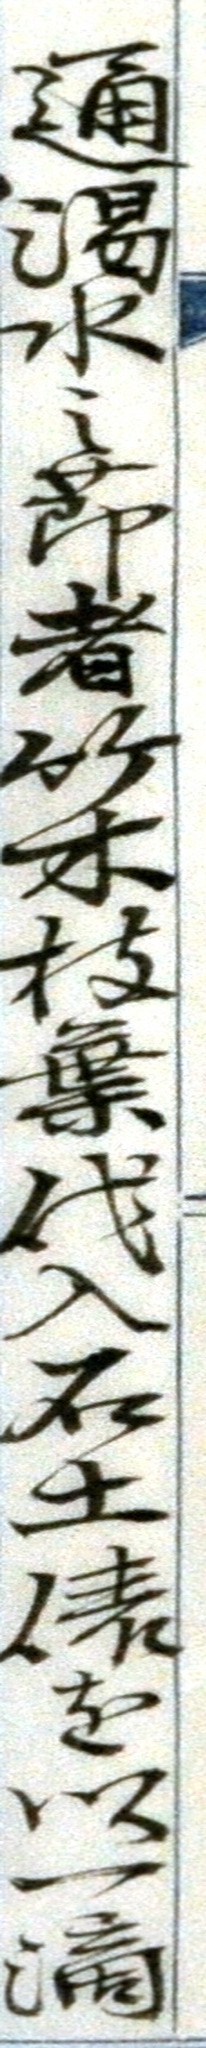通渇水之節者竹木枝葉伐入石土俵を以一滴
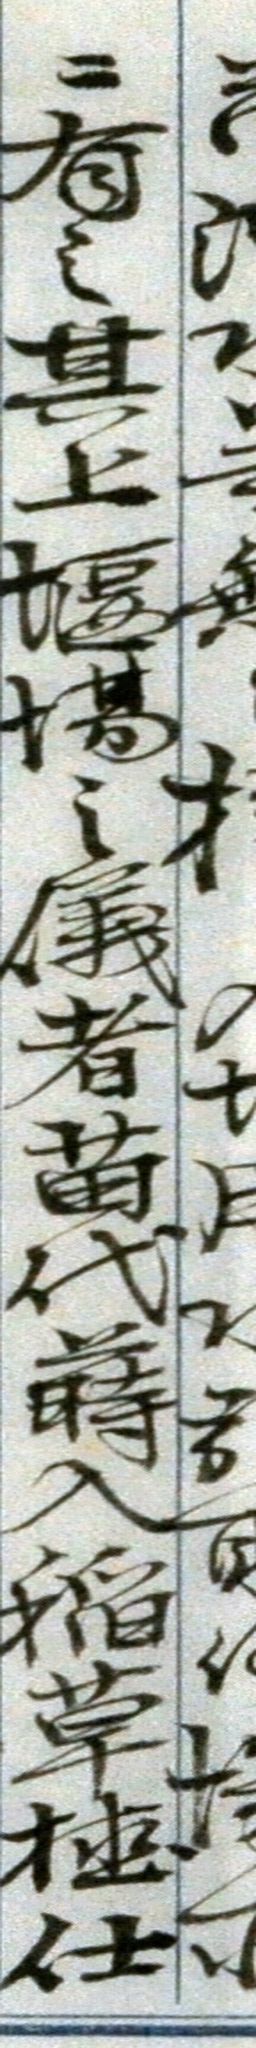ニ有之其上堰場之儀者苗代蒔入稲草植仕
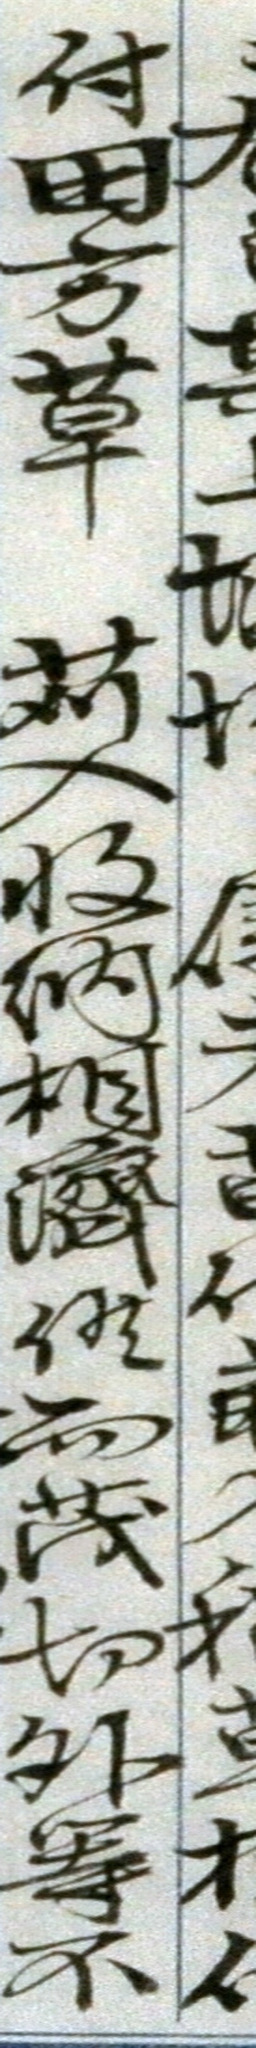付田方草刈入収納相済候茂切外等不
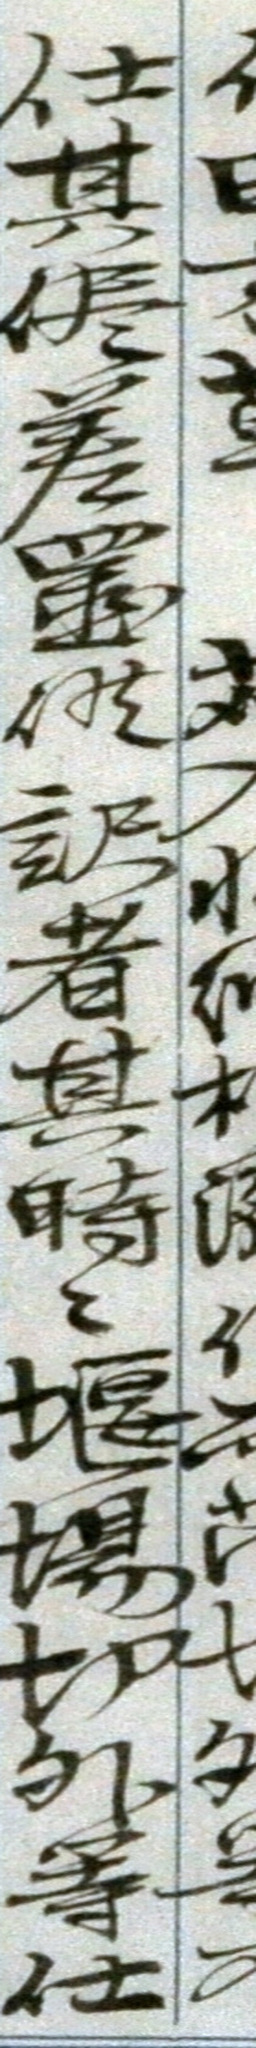仕其儘差置供訳者其時ニ堰場切外等仕
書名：天竜川通船難渋願并取極書
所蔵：伊那市立高遠町図書館・合同会社AMANE
